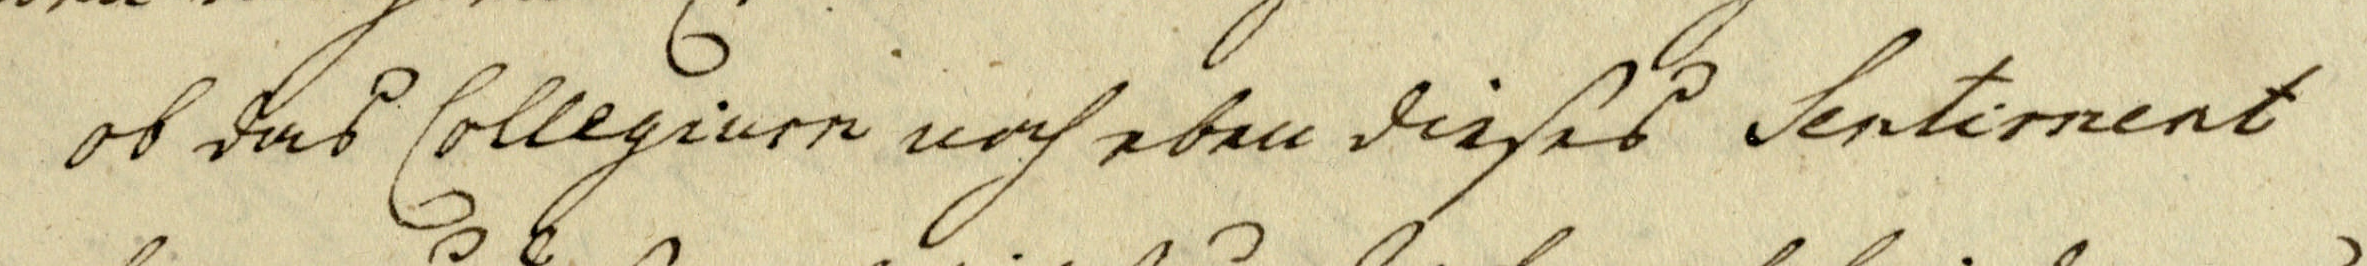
ob das Collegium noch eben dieses Sentiment
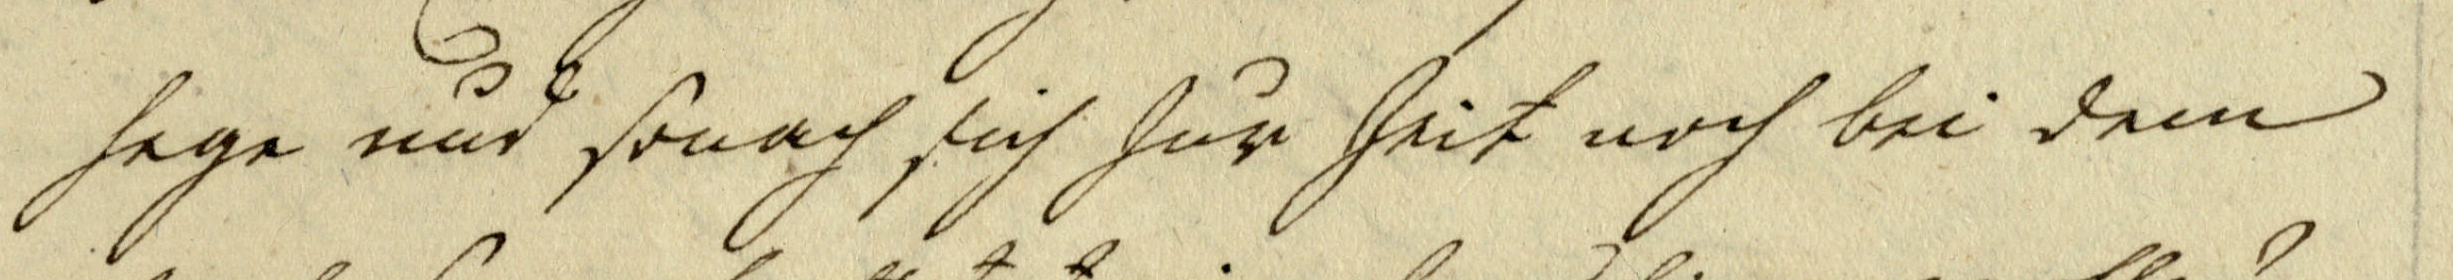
ge und sonach sich zur Zeit noch bei dem
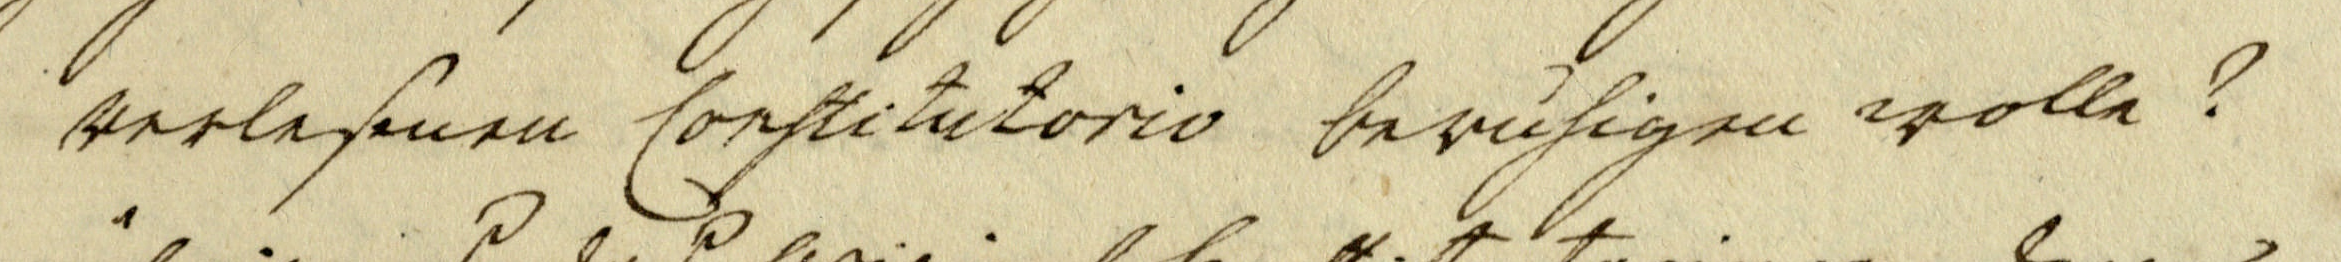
verlesenen Constitutorio beruhigen wolle?
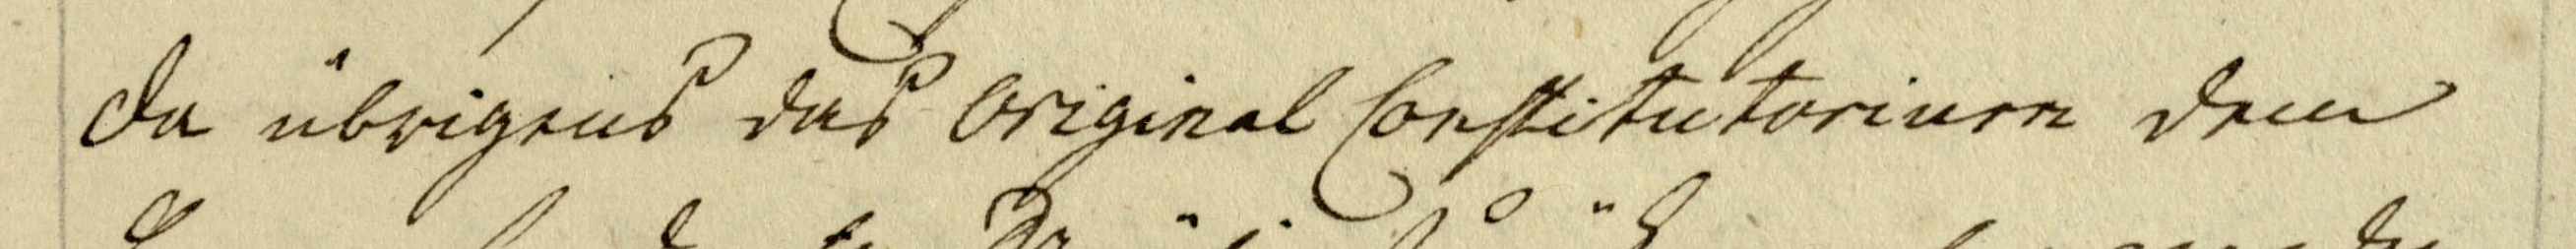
Da übrigens das Original Constitutorium dem
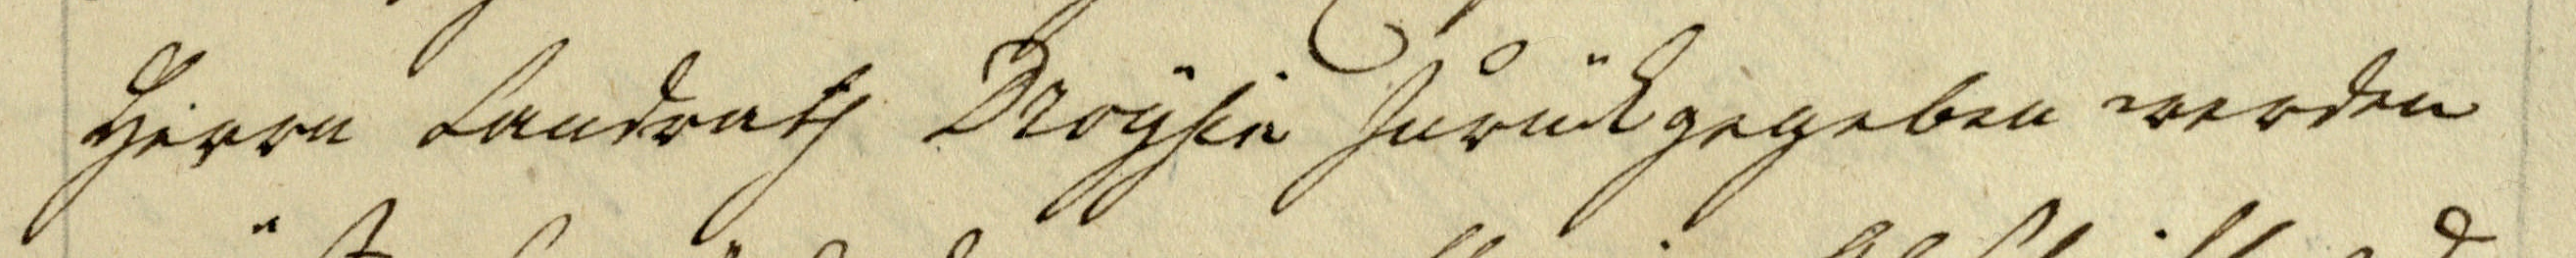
Herrn Landrath Droÿsen zurückgegeben werden
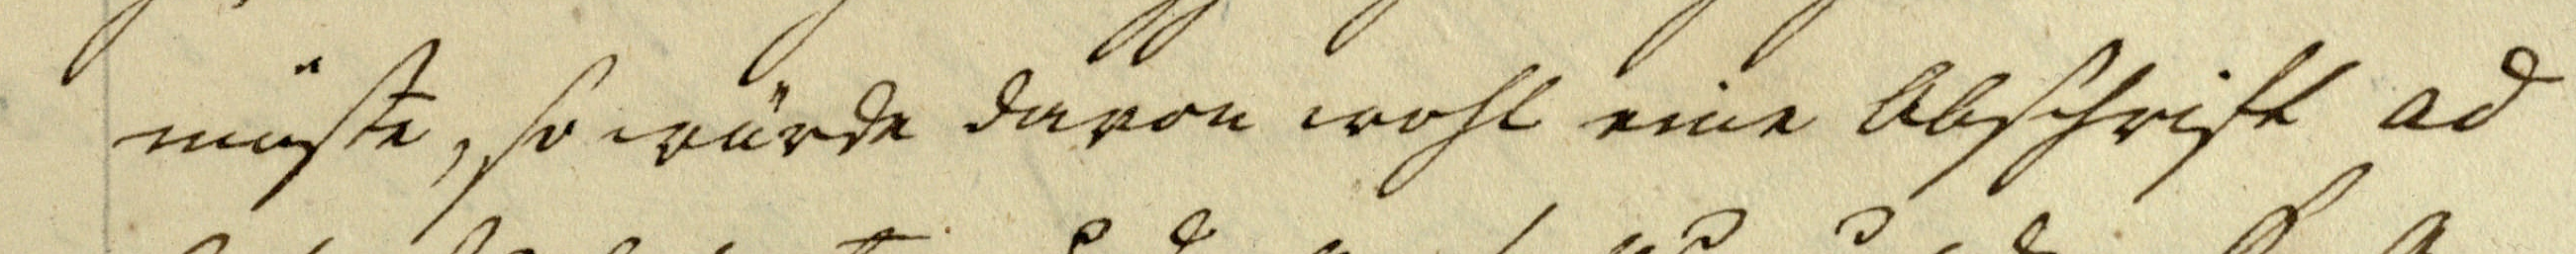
müßte, so würde davon wohl eine Abschrift ad
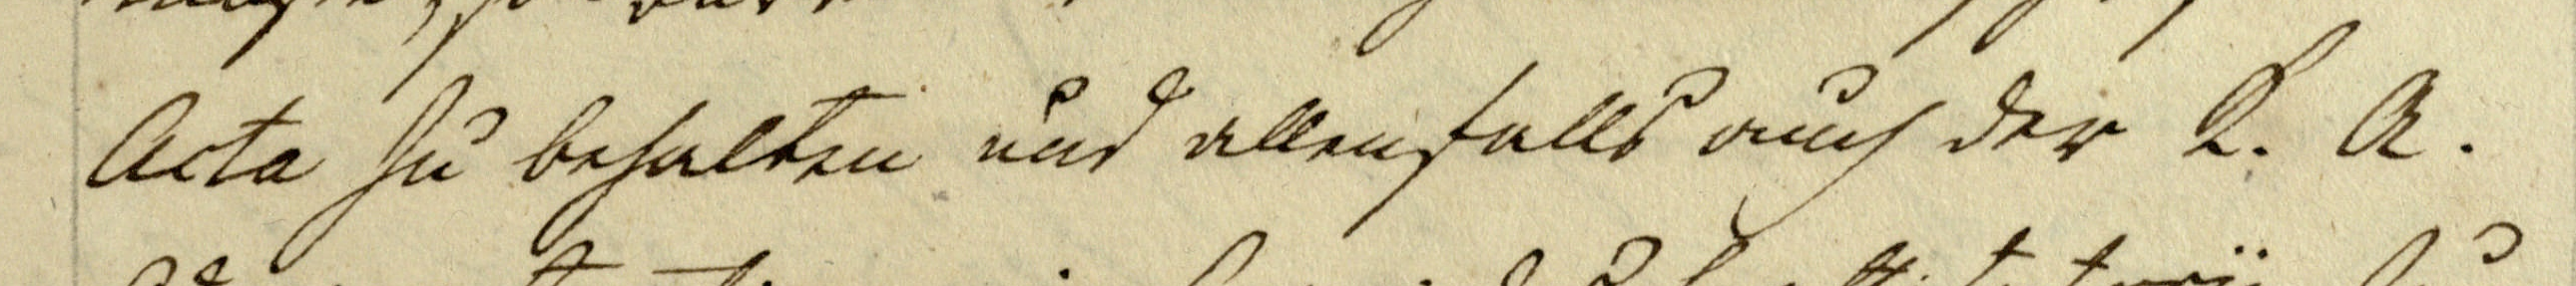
Acta zu behalten und allenfalls auch der K. A.
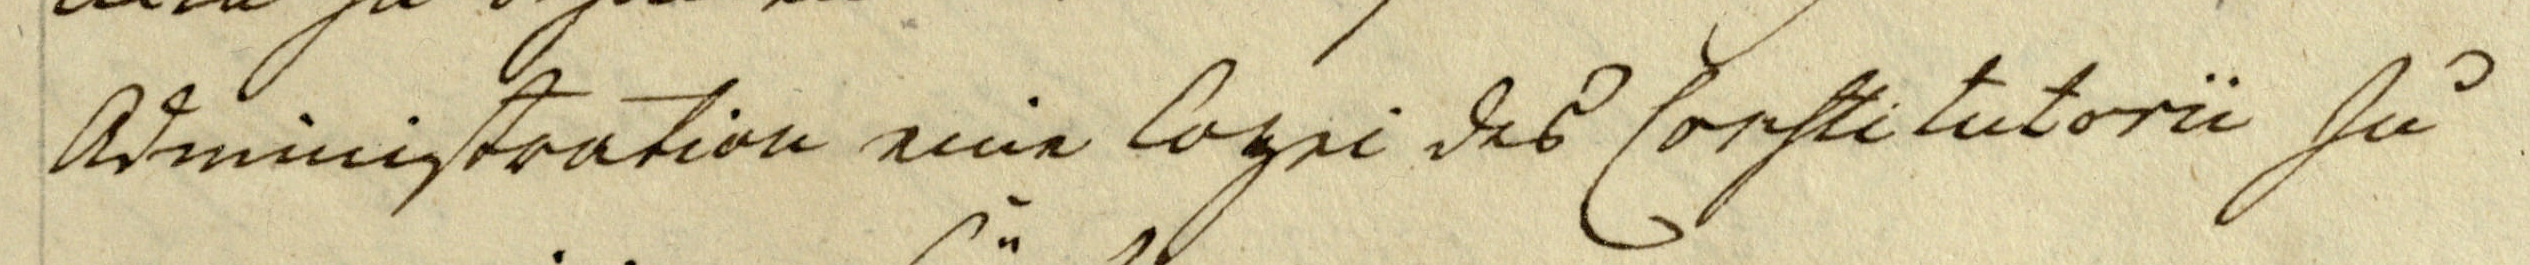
Administration eine Copei des Constitutorii zu
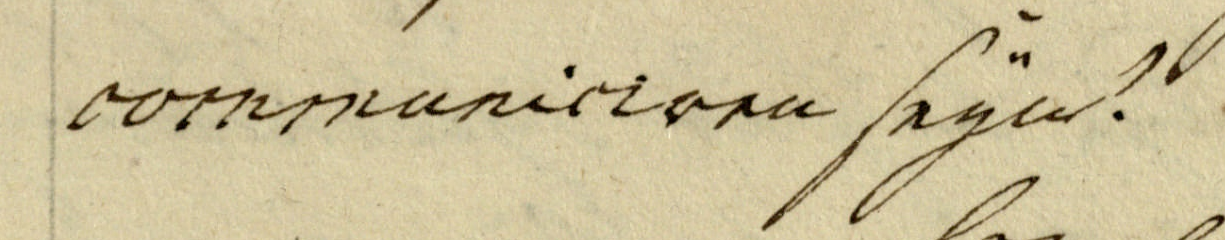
communiciren seÿn?
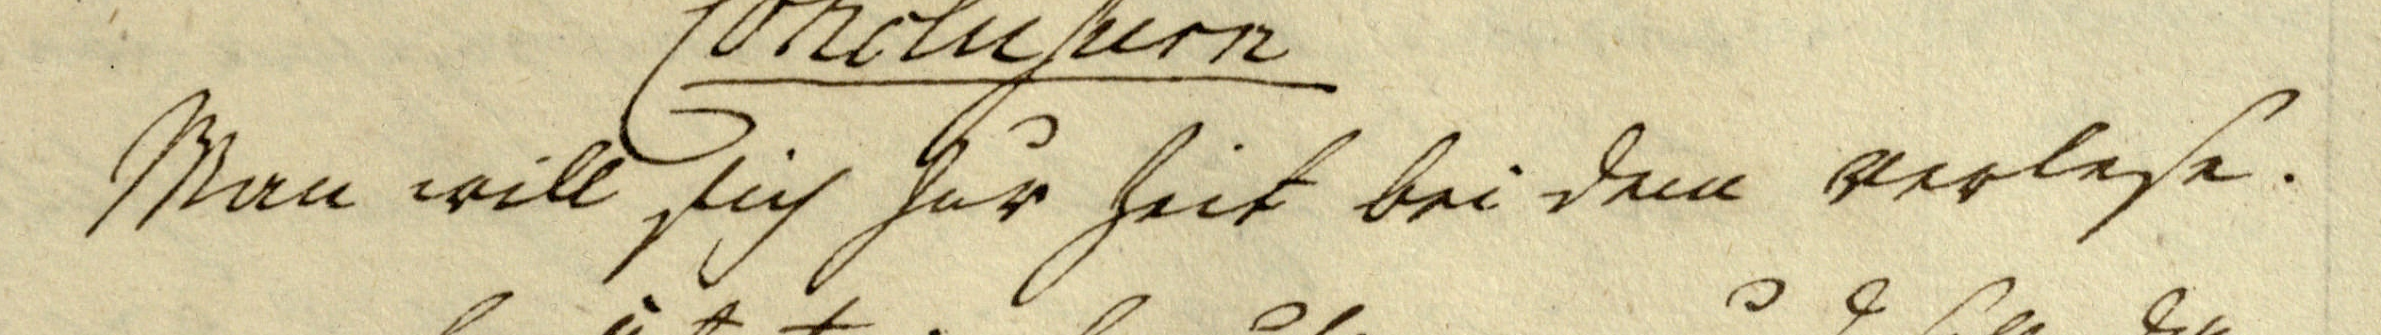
Man will sich zur Zeit bei dem verlese¬
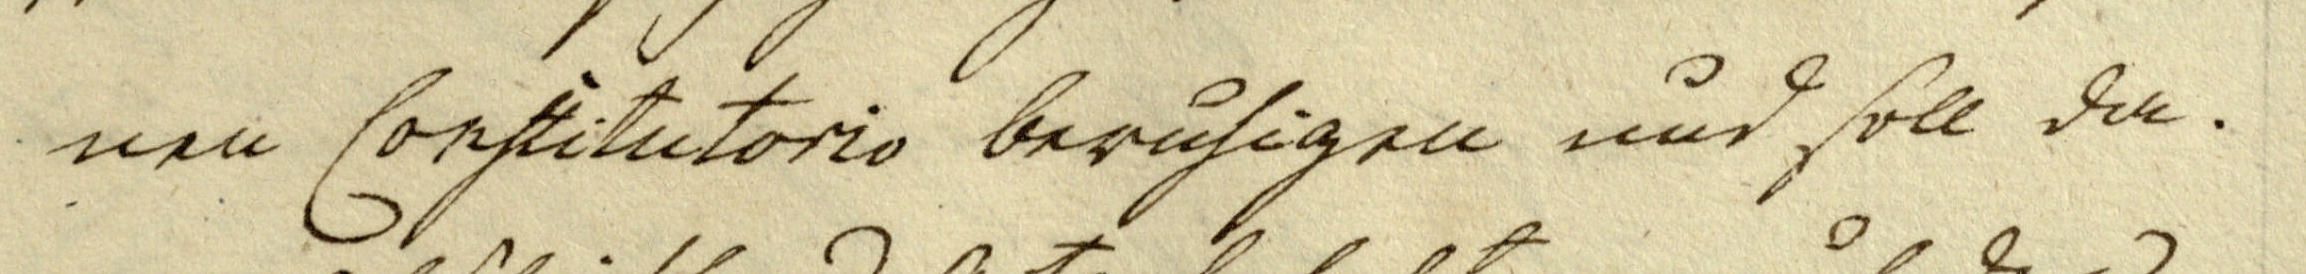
nen Constitutorio beruhigen und soll da¬
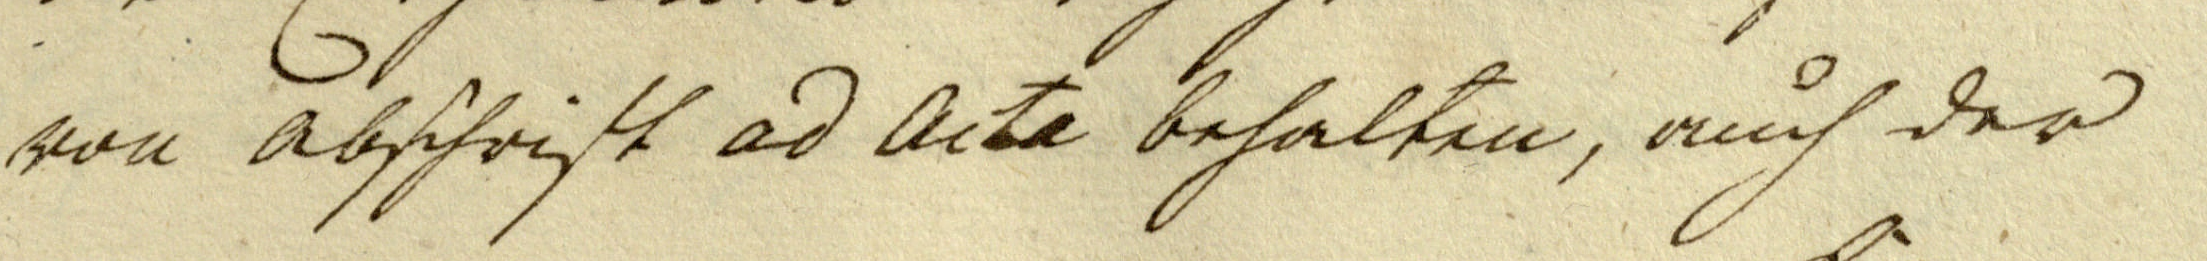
von Abschrift ad Acta behalten, auch der
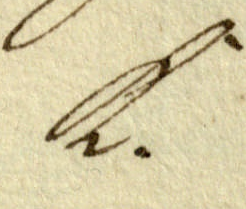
K.
